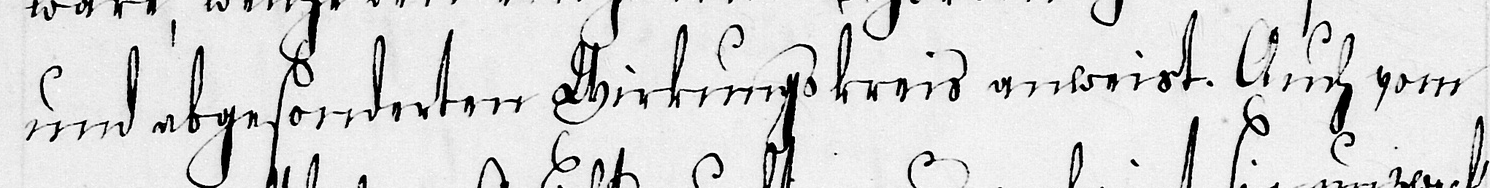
und abgesonderten Wirkungskreis anweist. Auch vom
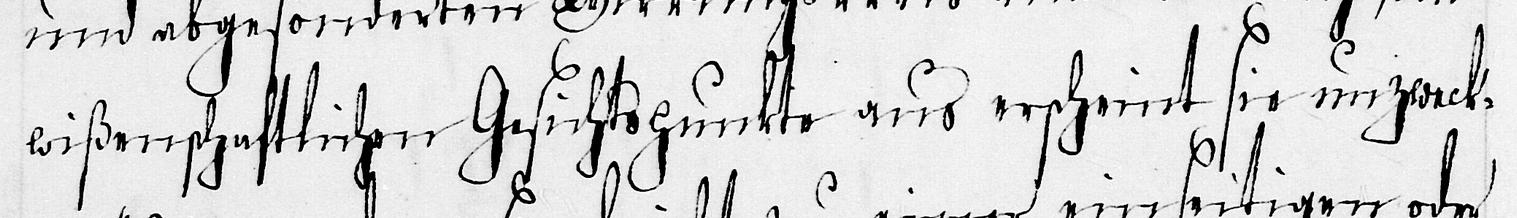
wißenschaftlichen Gesichtspunkte aus erscheint sie unzweck¬
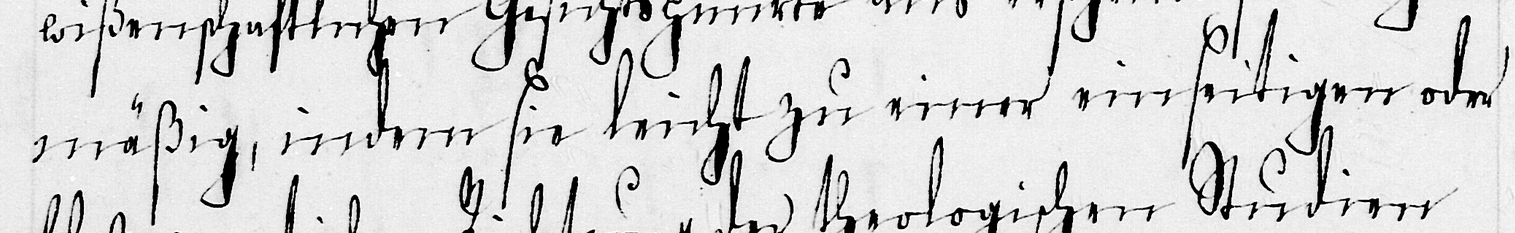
mäßig, indem sie leicht zu einer einseitigen oder
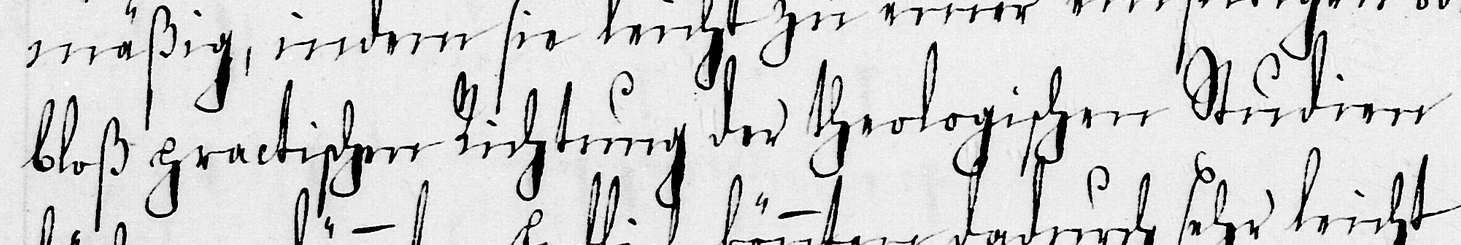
bloß practischen Richtung der theologischen Studien
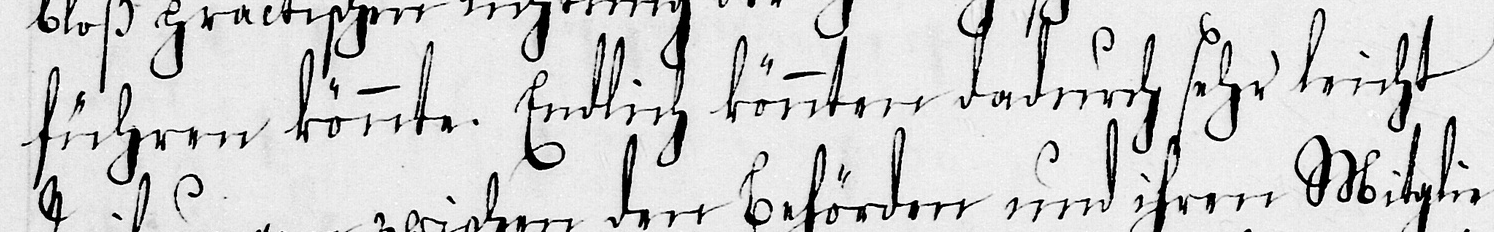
führen könnte. Endlich könnten dadurch sehr leicht
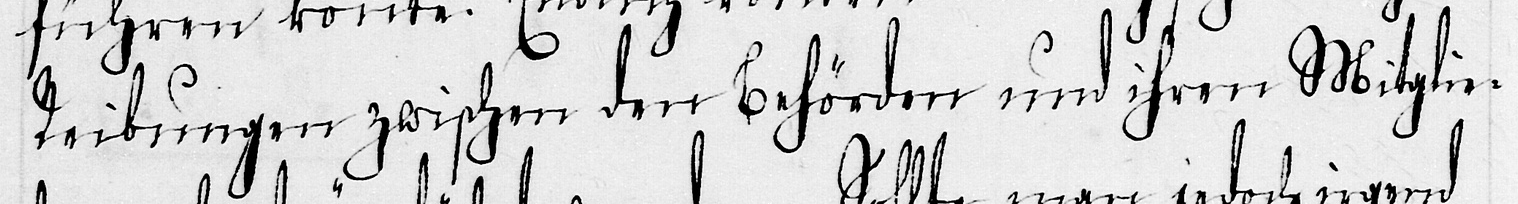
Reibungen zwischen den Behörden und ihren Mitglie¬
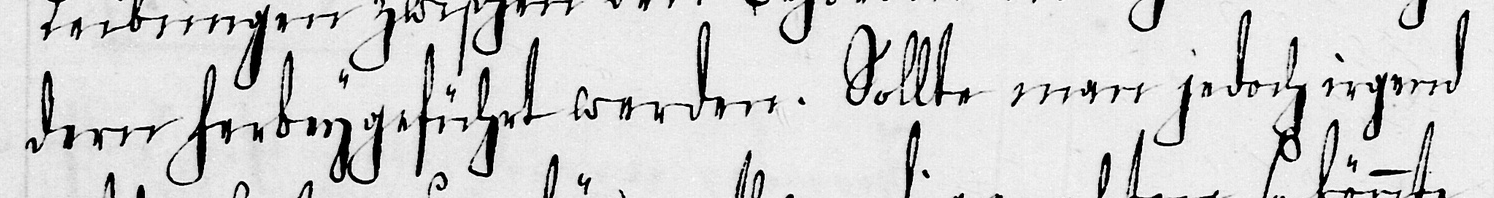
dern herbeygeführt werden. Sollte man jedoch irgend
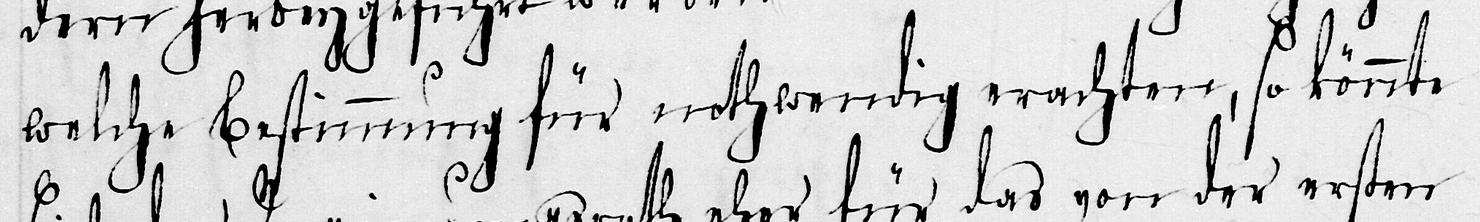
welche Bestimmung für nothwendig erachten, so könnte
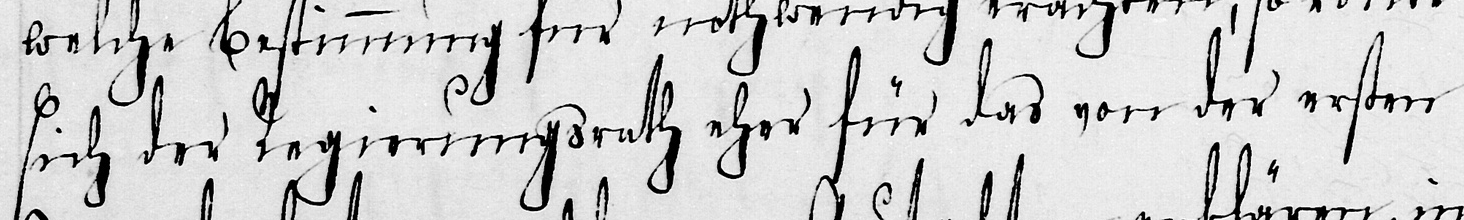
sich der Regierungsrath eher für das von der ersten
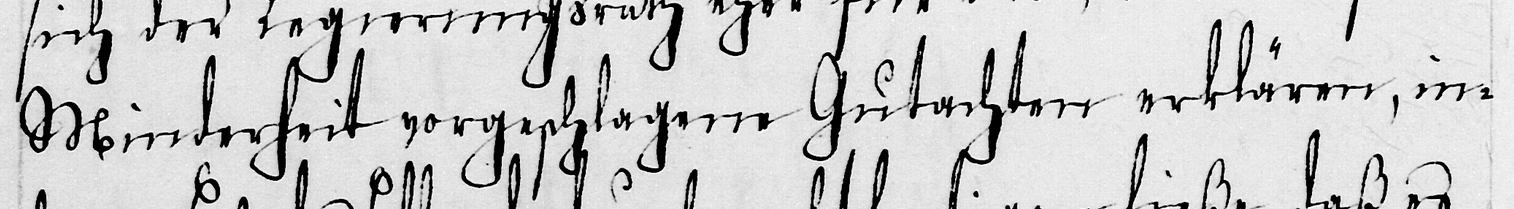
Minderheit vorgeschlagene Gutachten erklären, in¬
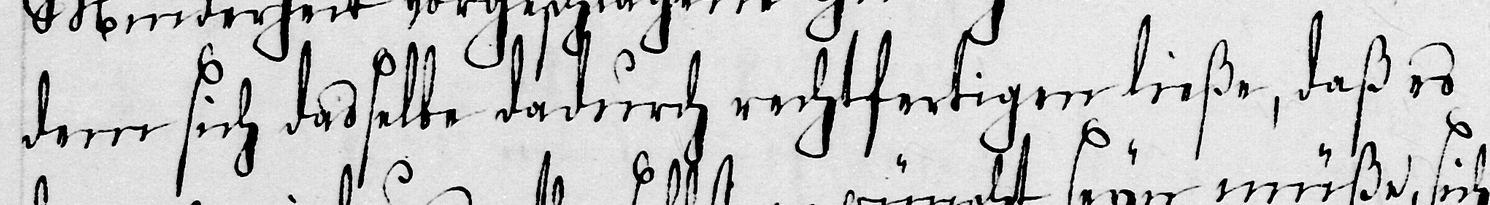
dem sich dasselbe dadurch rechtfertigen ließe, daß es
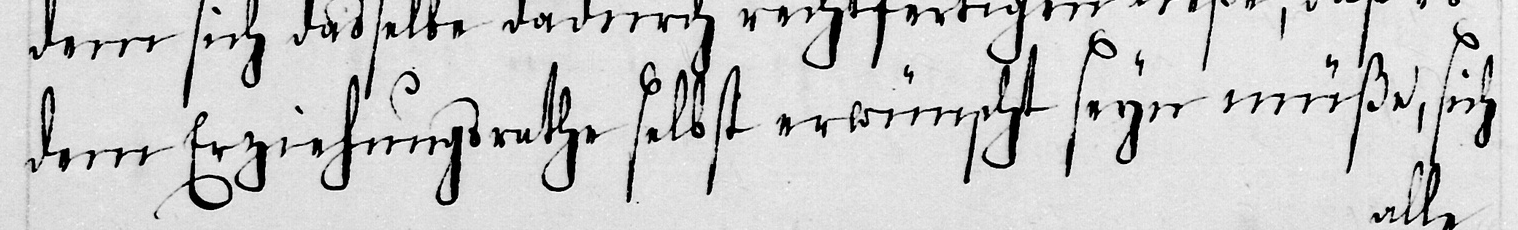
dem Erziehungsrathe selbst erwünscht sein müße, sich
